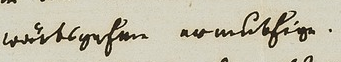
wärtsgehen ermuthige.
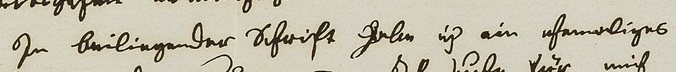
In beiligender Schrift habe ich ein ehemaliges
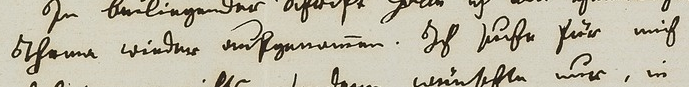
Thema wieder aufgenommen. Ich suche für mich
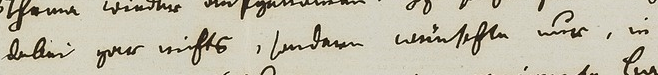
dabei gar nichts, sondern wünschte nur, in
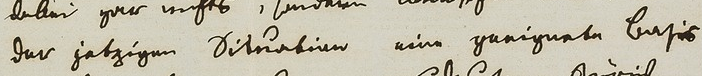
der jetzigen Situation eine geeignete Basis
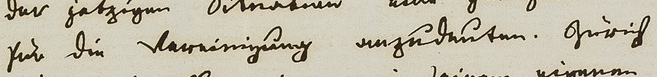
für die Vereinigung anzudeuten. Zürich
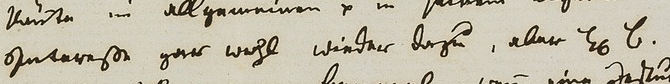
Interesse gar wohl wieder dazu, aber Herr B.
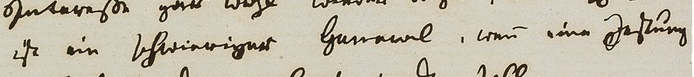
ist ein schwieriger General, wenn eine Festung
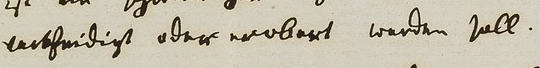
vertheidigt oder erobert werden soll.
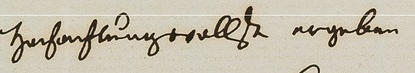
Hochachtungsvollst ergeben
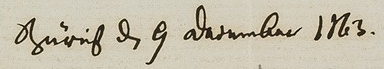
Zürich den 9 December 1863.
